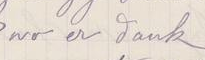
wo er dank
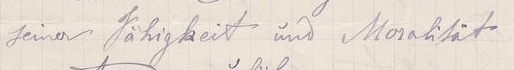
seiner Fähigkeit und Moralität
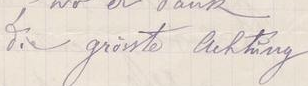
die grösste Achtung
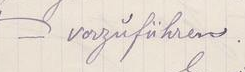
– vorzuführen.
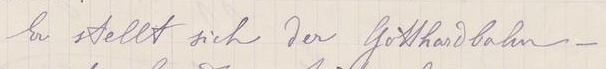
Er stellt sich der Gotthardbahn-
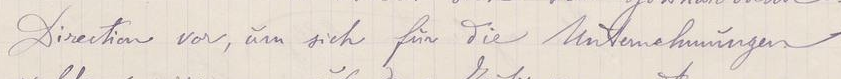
Direction vor, um sich für die Unternehmungen
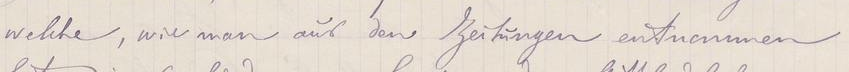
welche, wie man aus den Zeitungen entnommen
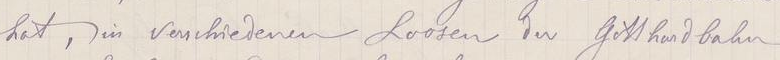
hat, in verschiedenen Loosen der Gotthardbahn
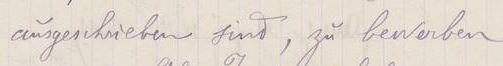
ausgeschrieben sind, zu bewerben.
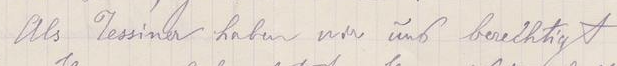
Als Tessiner haben wir uns berechtigt
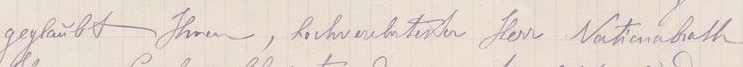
geglaubt Ihnen, hochverehrtester Herr Nationalrath,
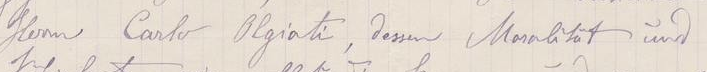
Herrn Carlo Olgiati, dessen Moralität und
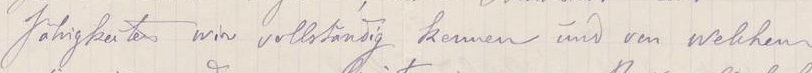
Fähigkeiten wir vollständig kennen und von welchem
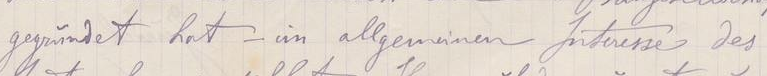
gegründet hat – im allgemeinen Interesse des
